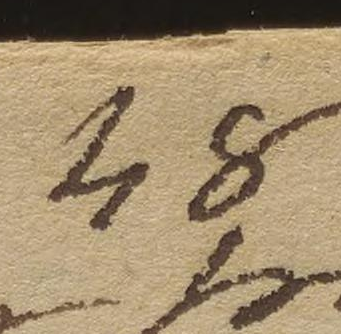48
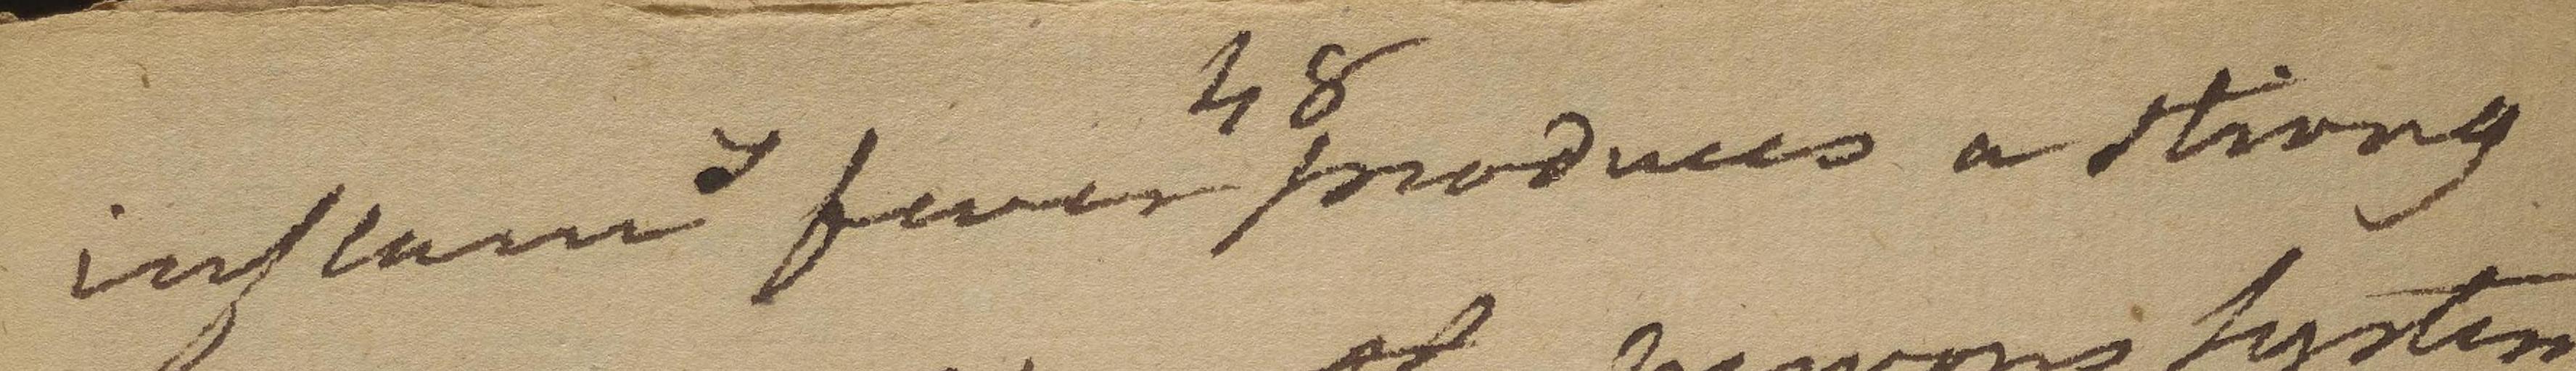inflam^y fever produces a strong
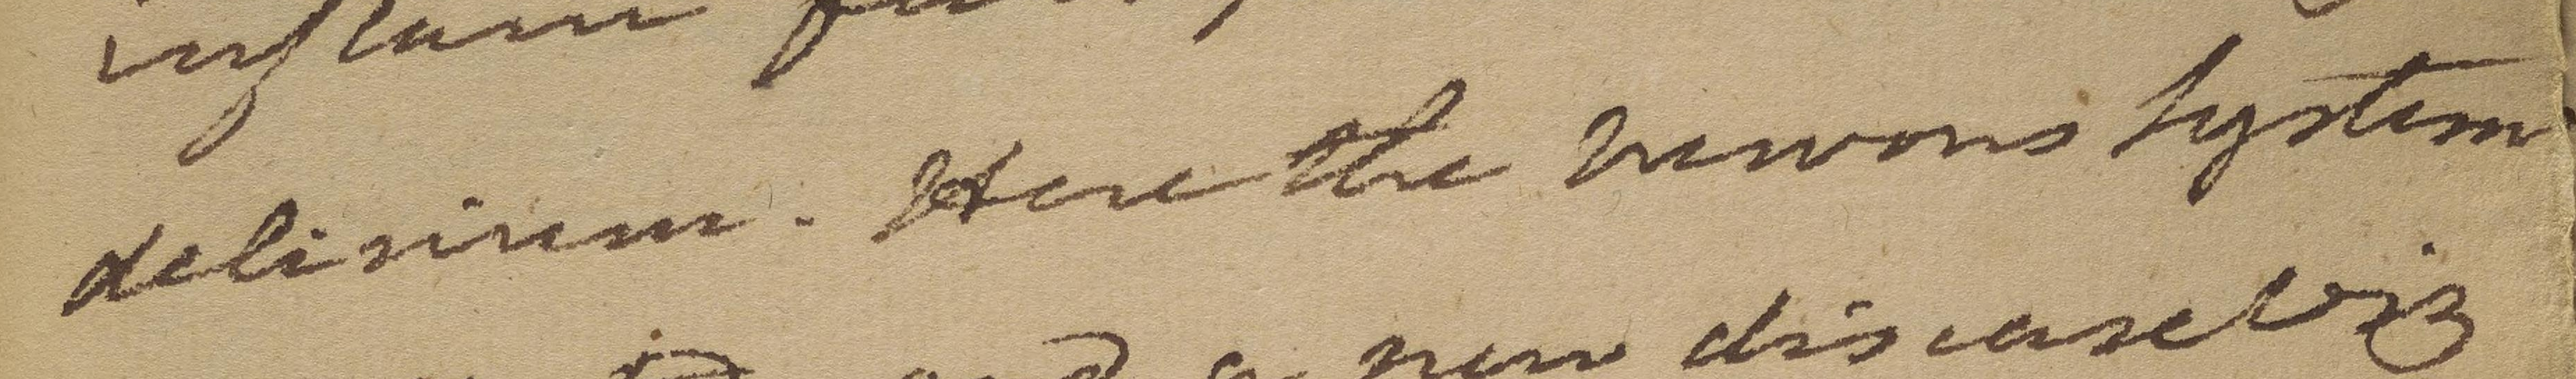delirium. Here the nervous system
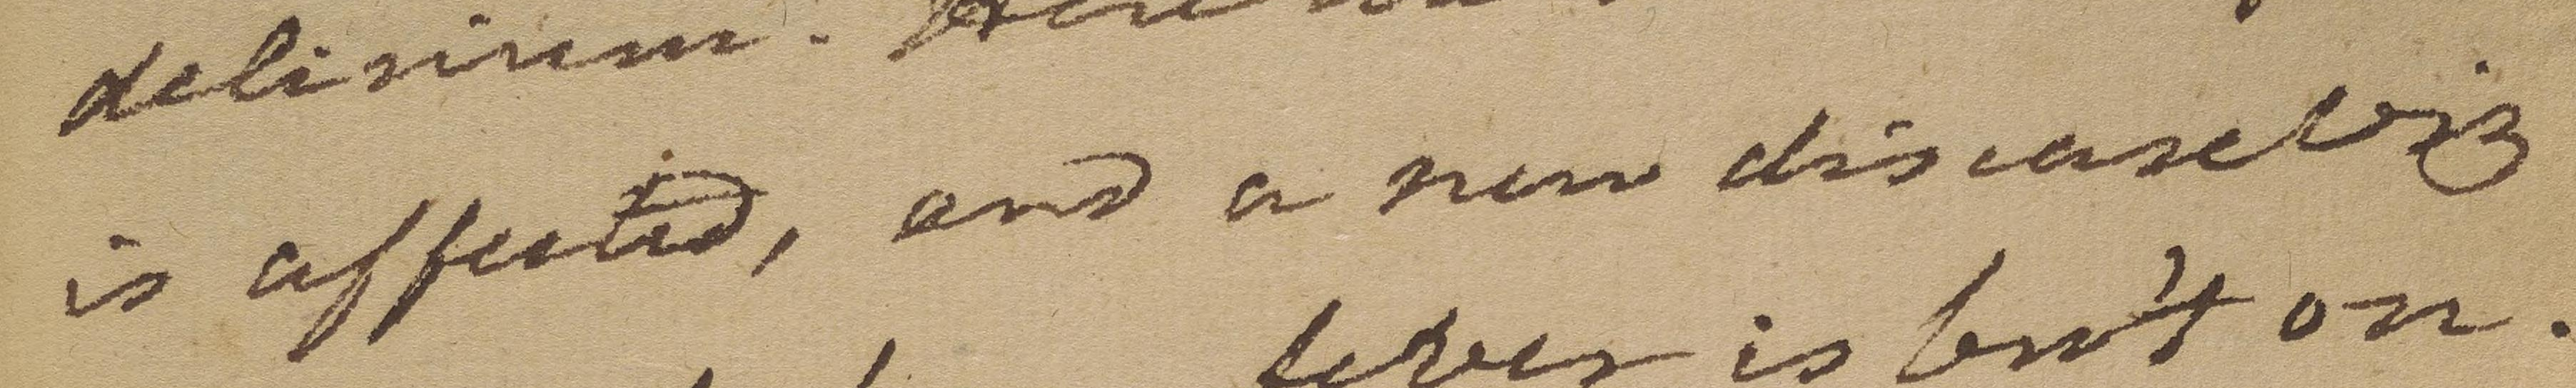is affected, and a new disease viz.
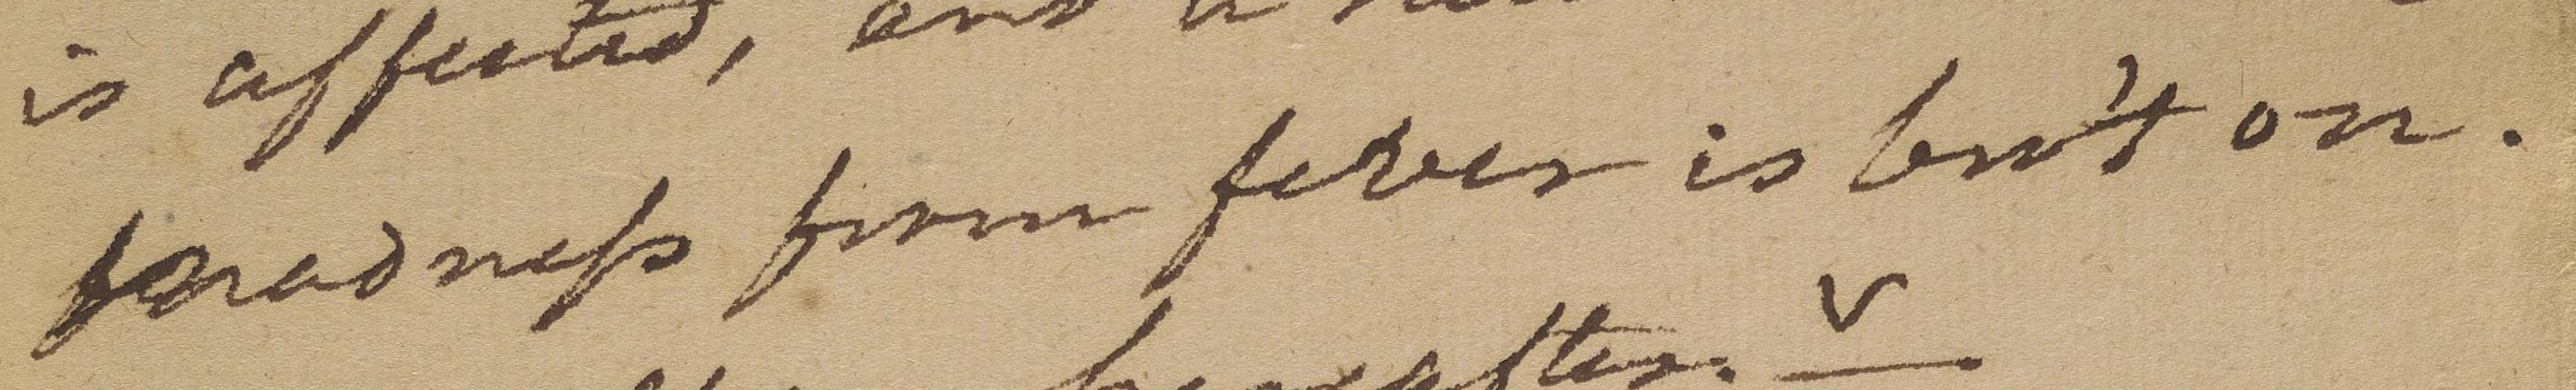spradness from fever is bro't on.
